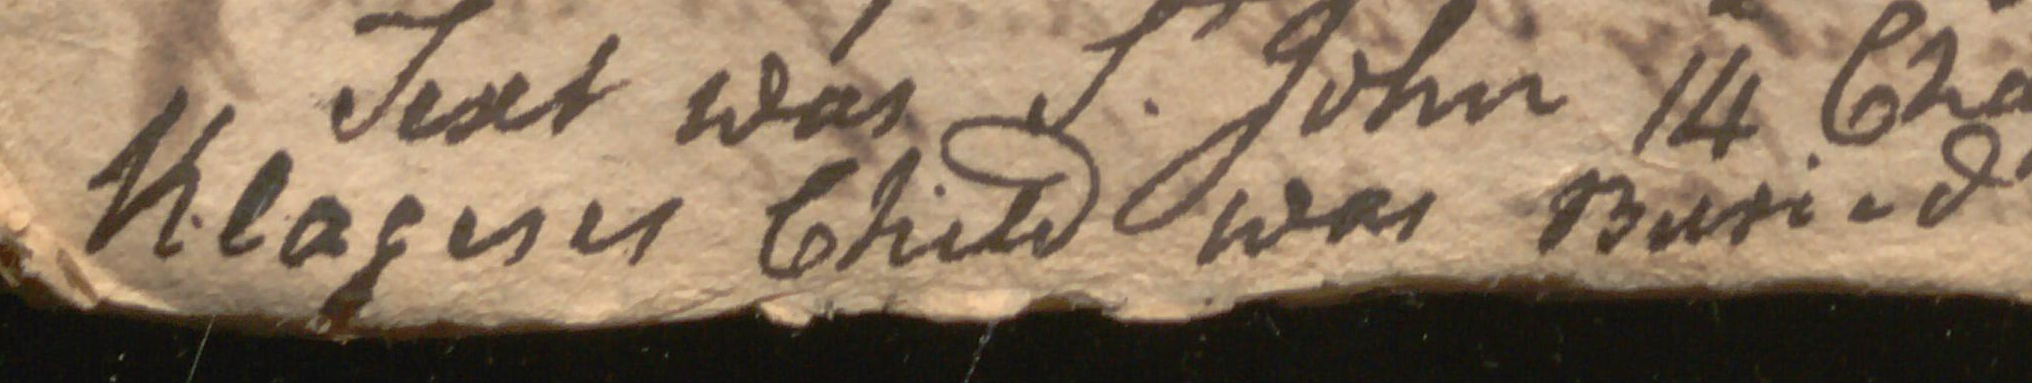Klageses Child was Buried
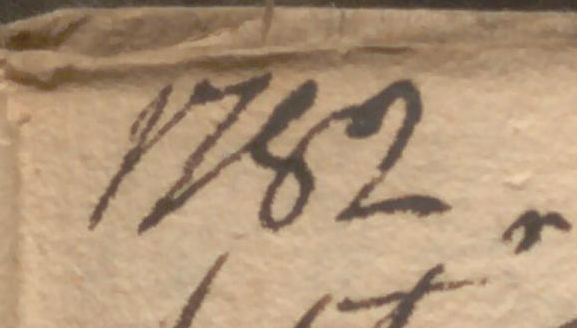1782
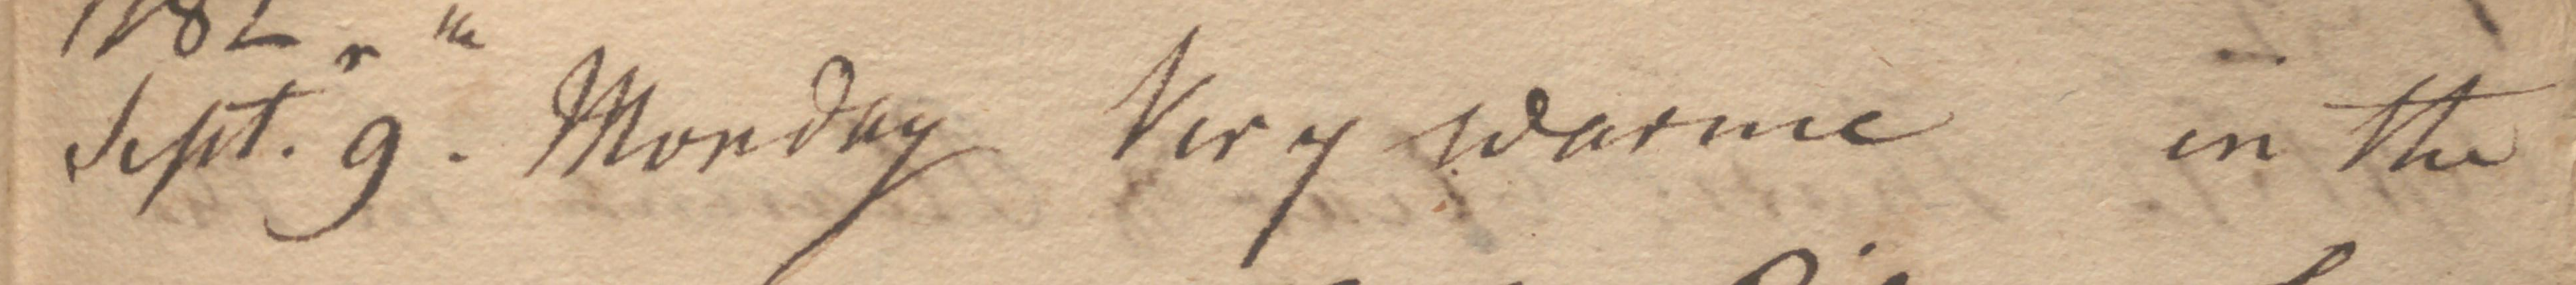Sept^r. 9^th. Monday Very warme in the
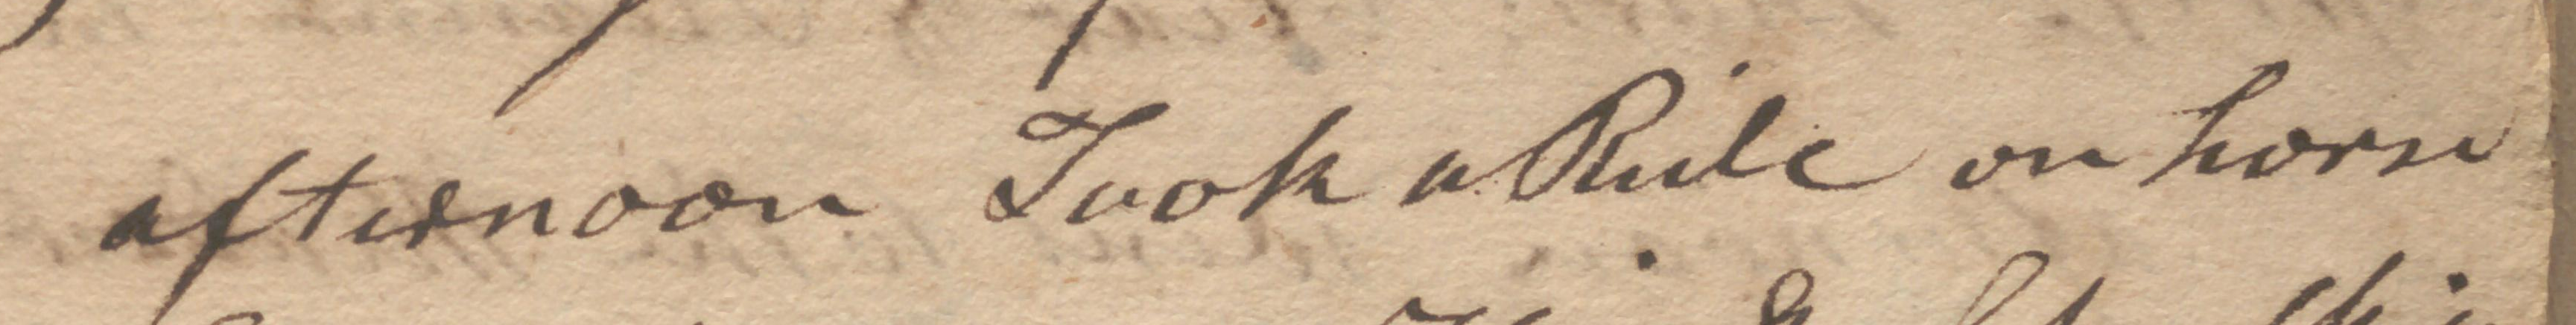afternoon Took a Ride on horse
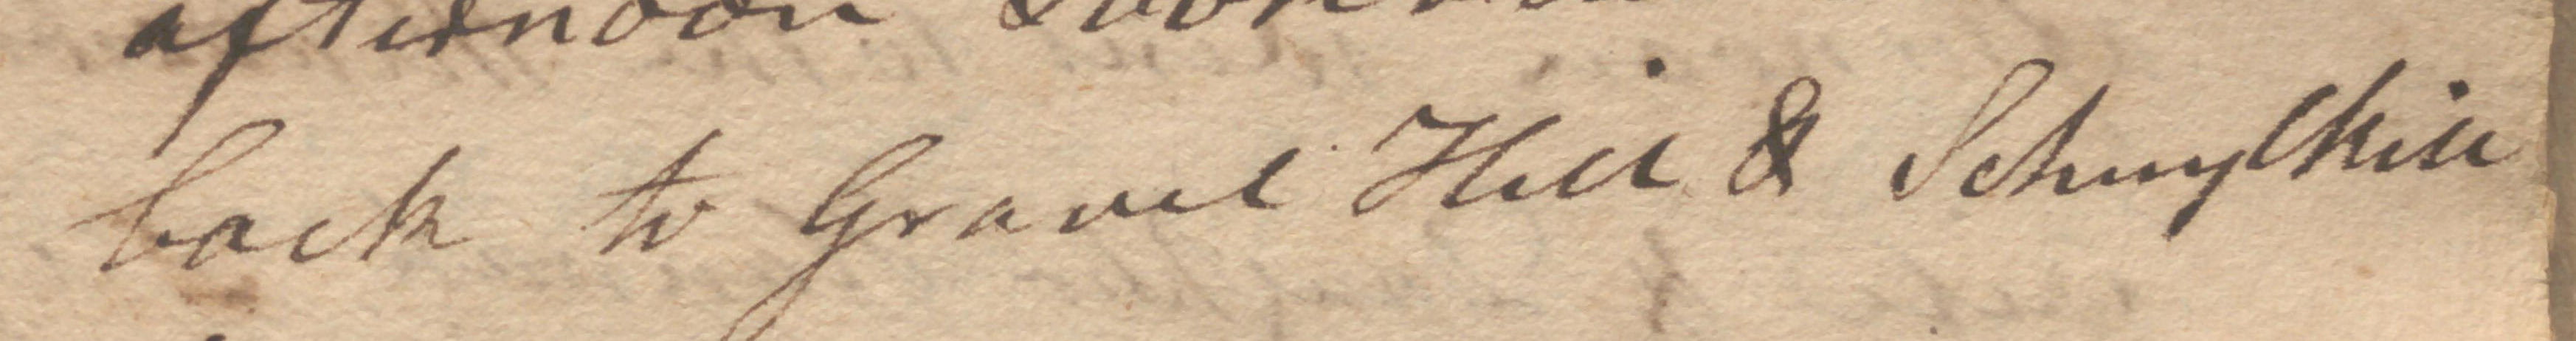back to Gravel Hill & Schuylkill
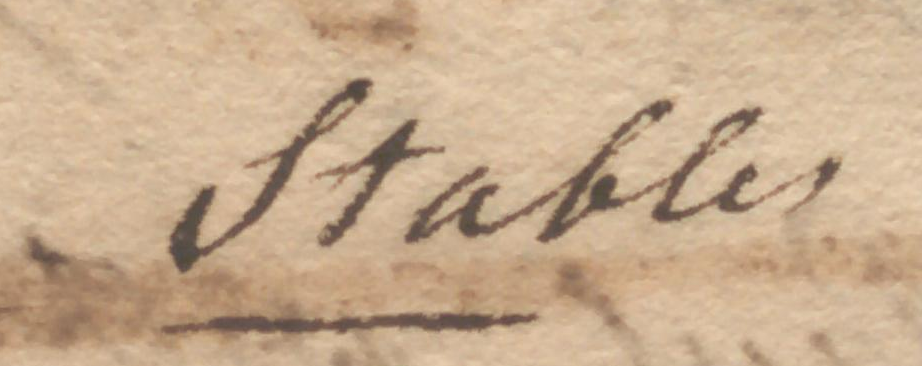Stables
